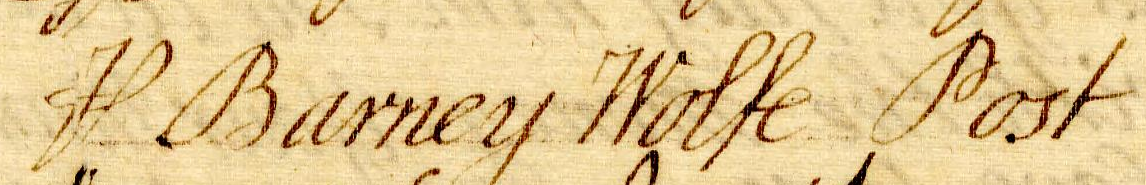Per Barney Wolfe Post
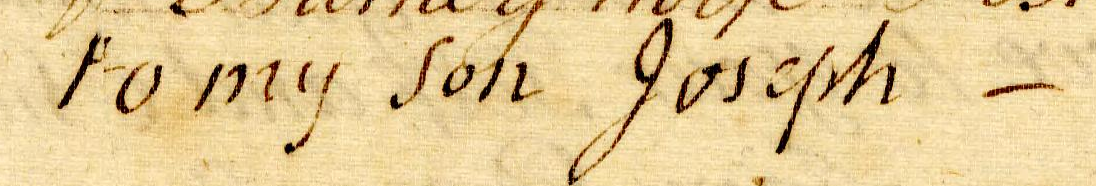to my Son Joseph -
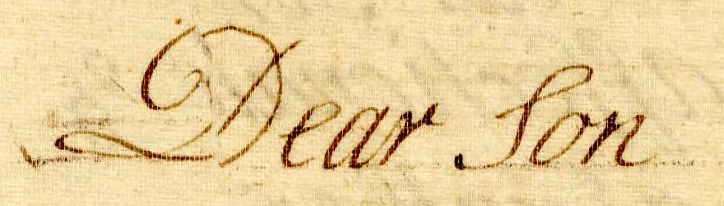Dear Son
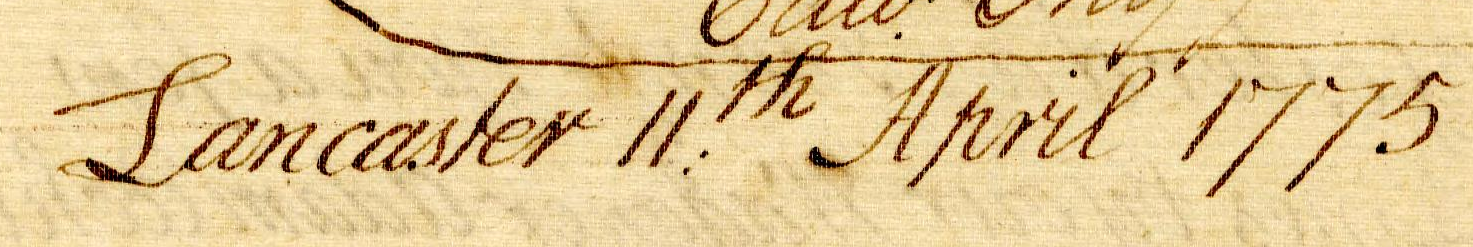Lancaster 11:^th April 1775
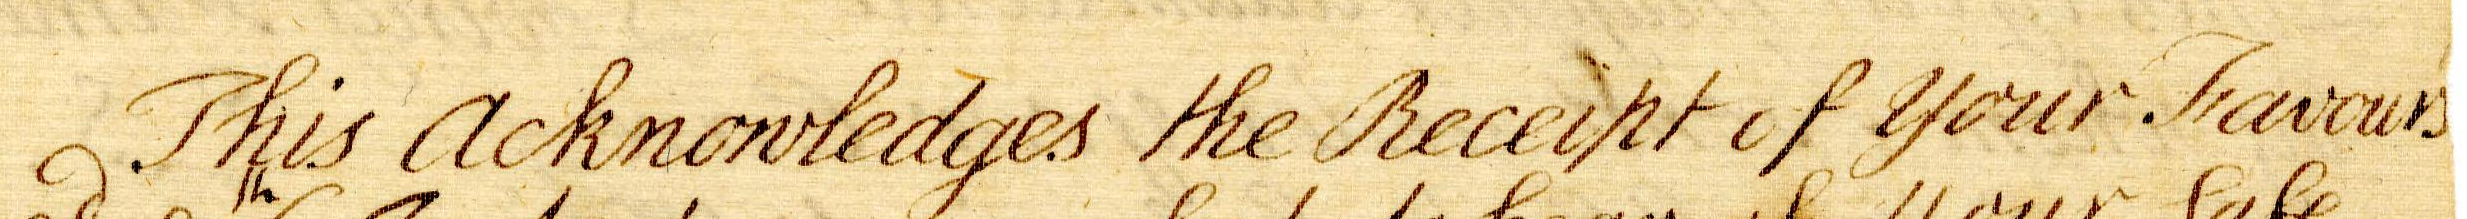This Acknowledges the Receipt of Your Favours
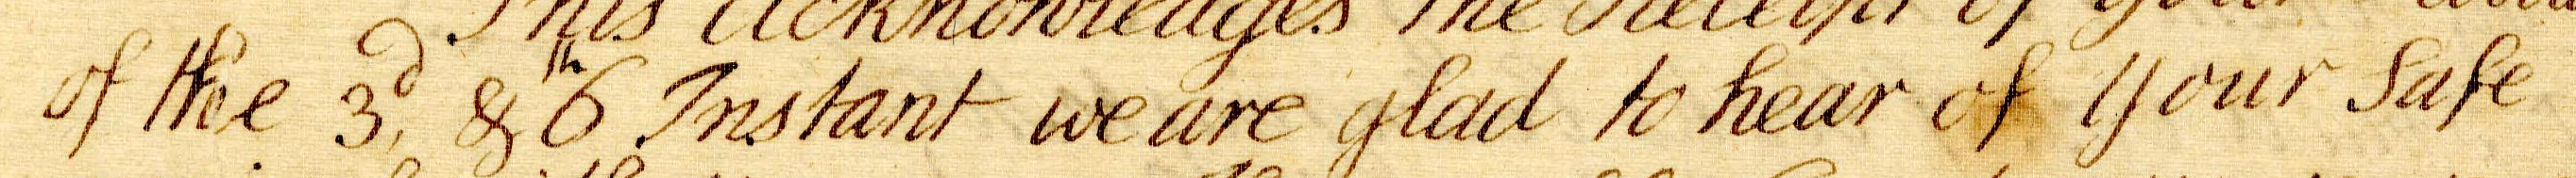of the 3,^d & 6 Instant we are glad to hear of your Safe
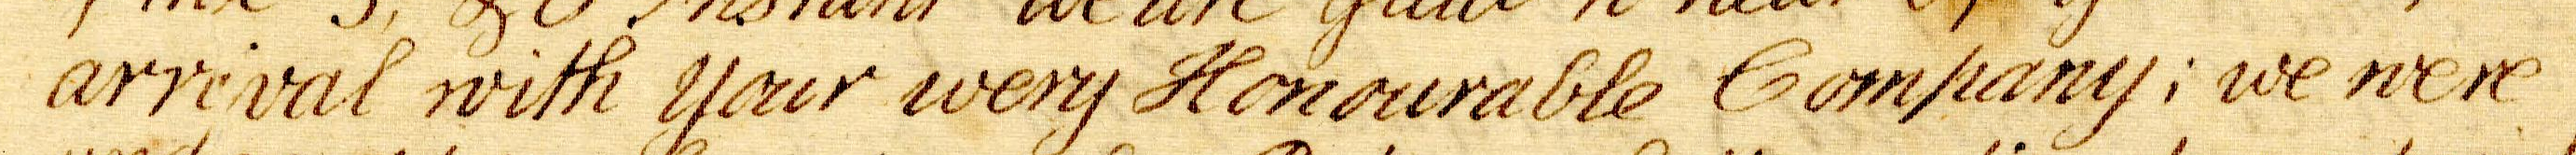arrival with Your every Honourable Company; we were
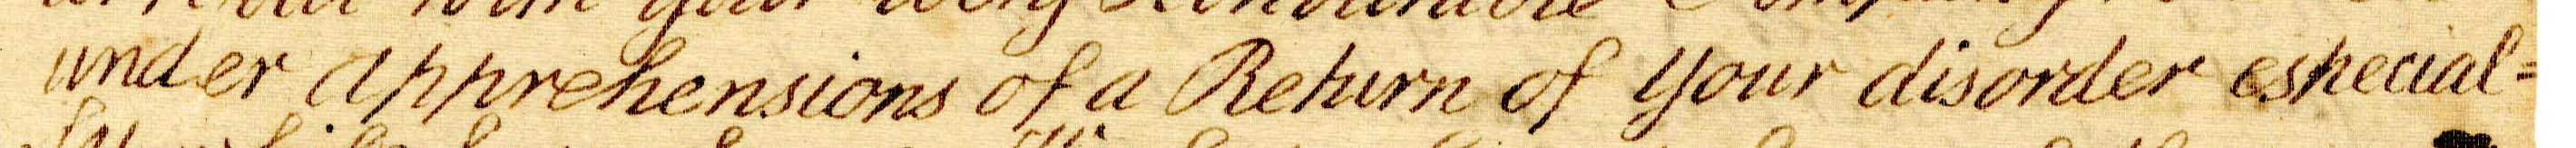under Apprehensions of a Return of Your disorder especial=
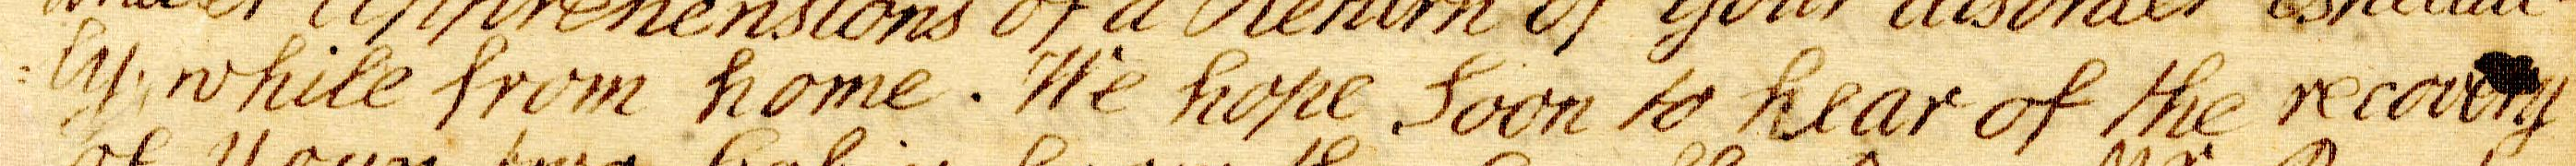=ly, while from home. We hope Soon to hear of the recovery
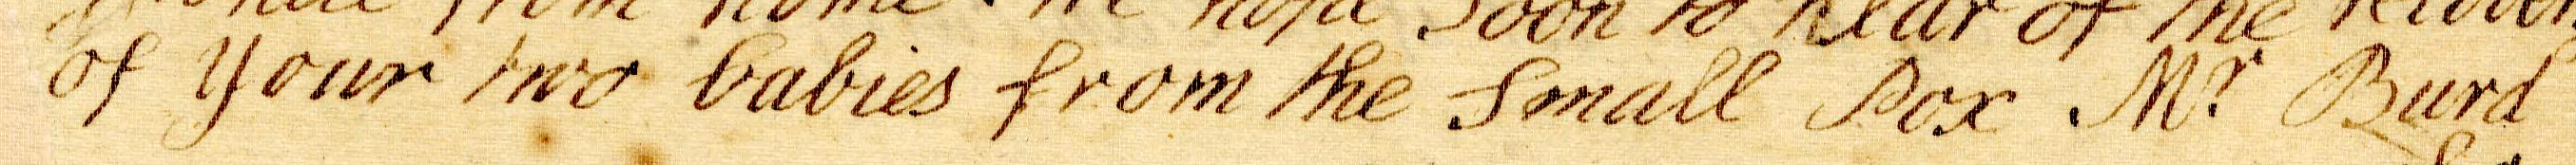of Your two babies from the Small Pox Mr Burd
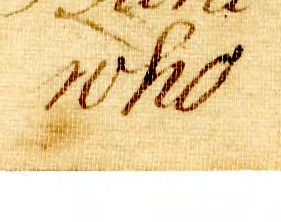who
